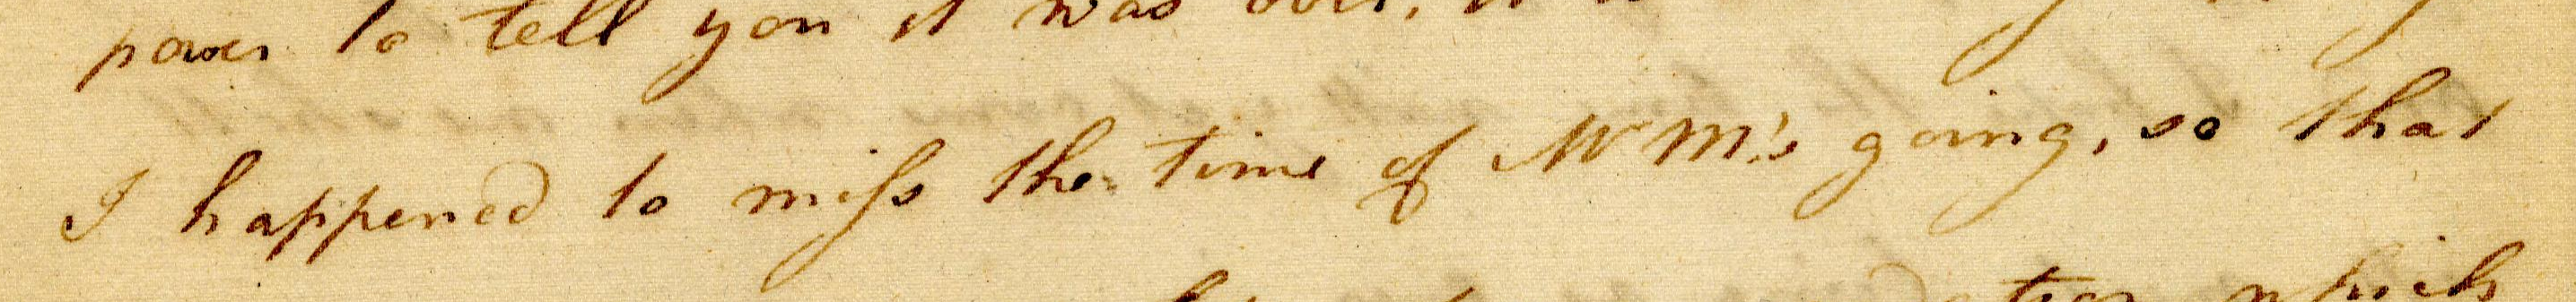I happened to miss the time of M^r M.'s going, so that
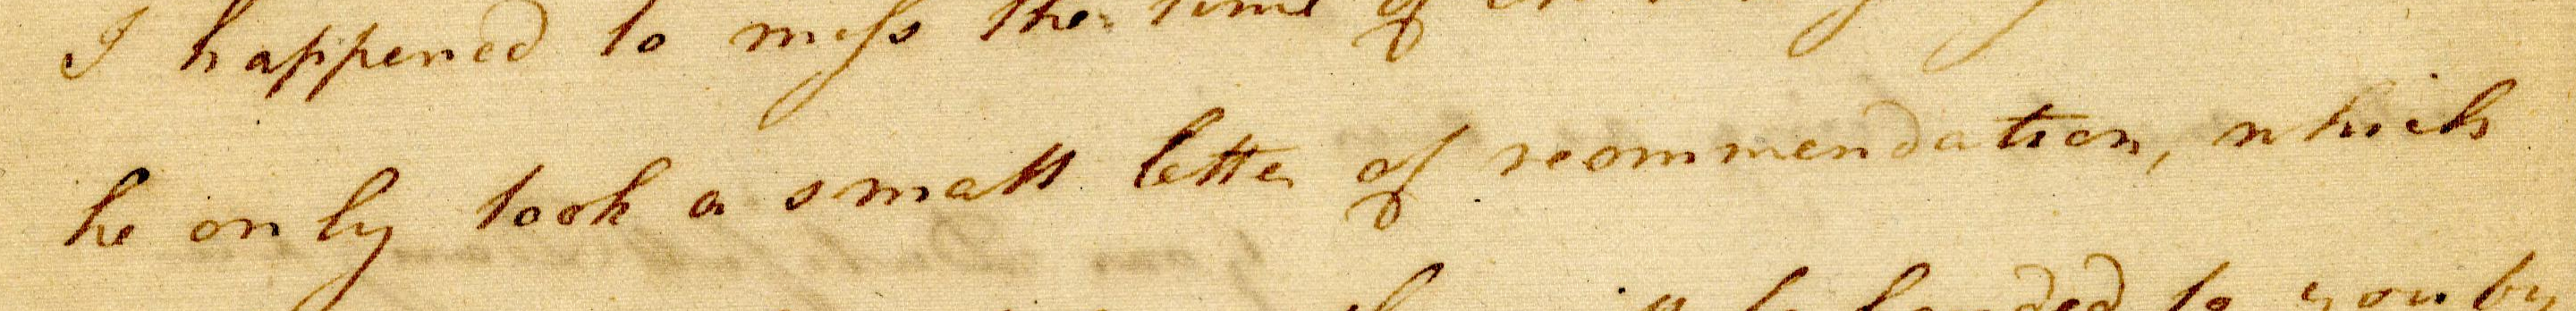he only took a small letter of reommendation, which
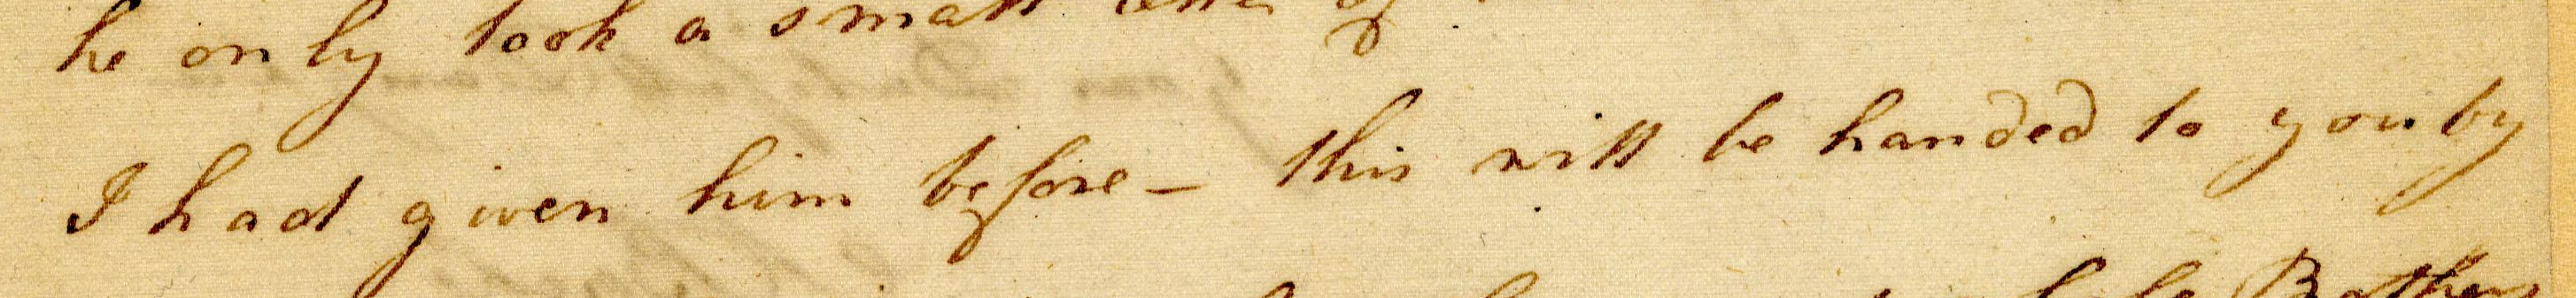I had given him before- this will be handed to you by
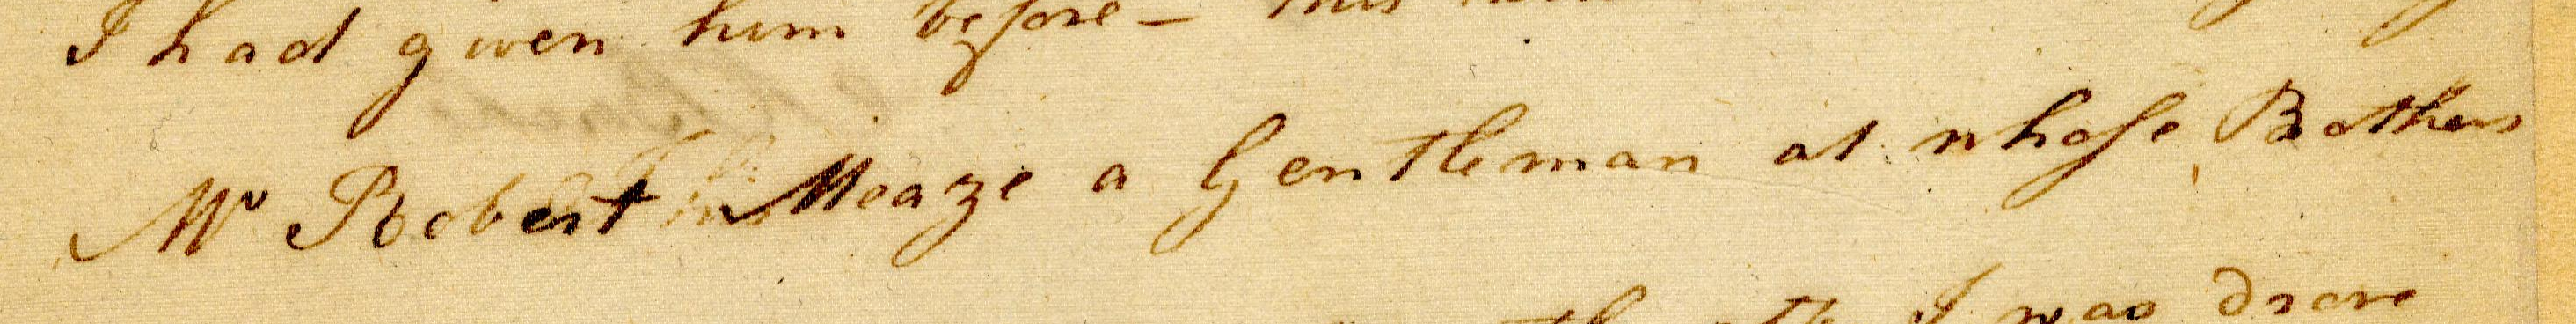M^r Robert Meaze a Gentleman at whose Brothers
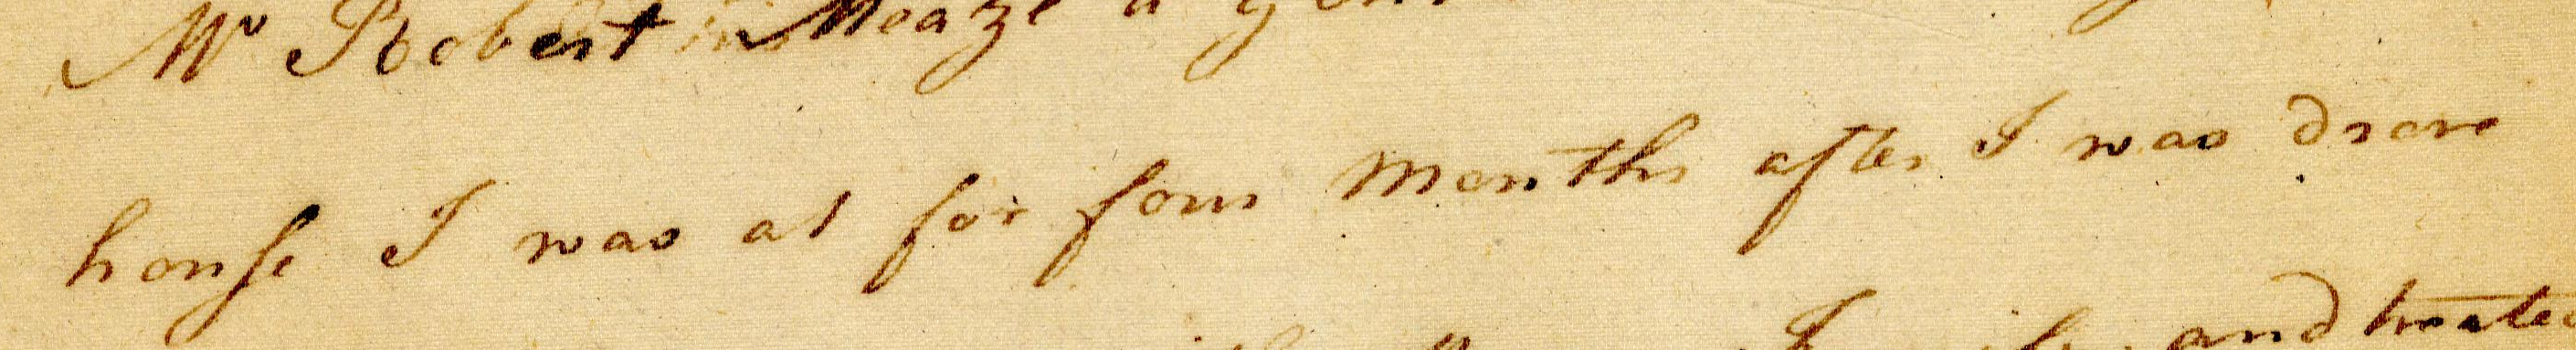house I was at for four Months after I was drove
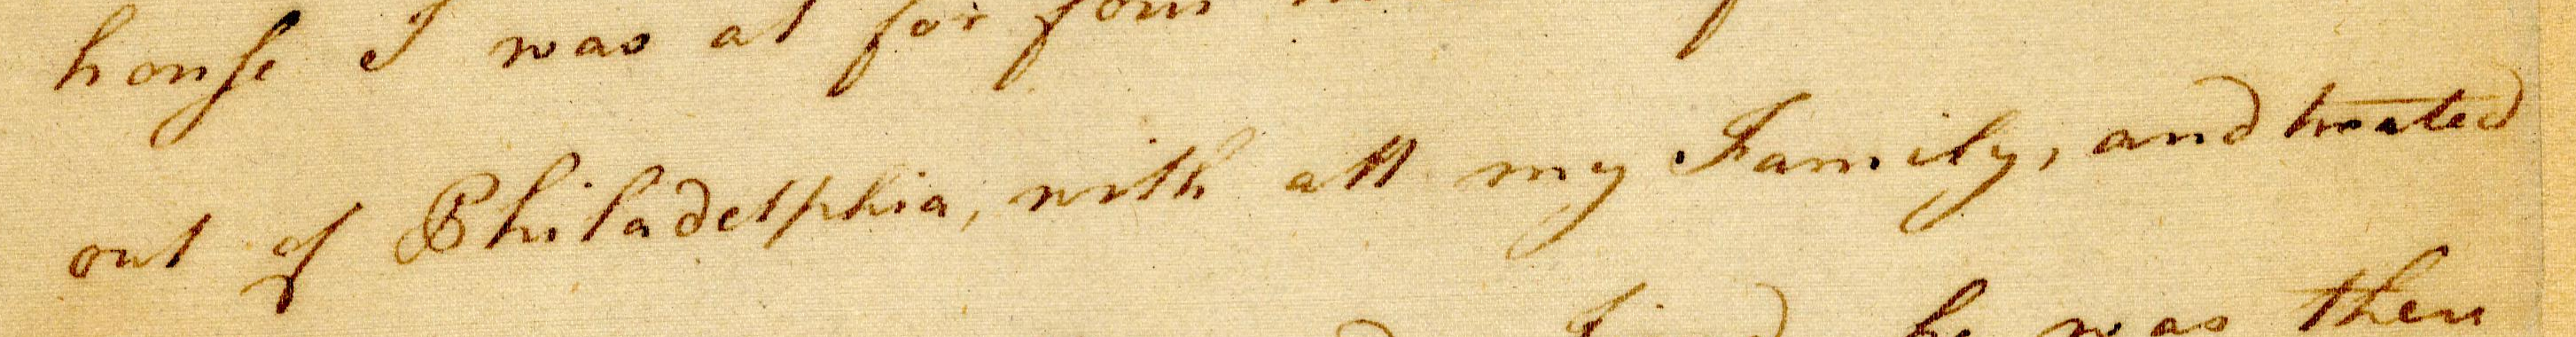out of Philadelphia, with all my Family, and treated
